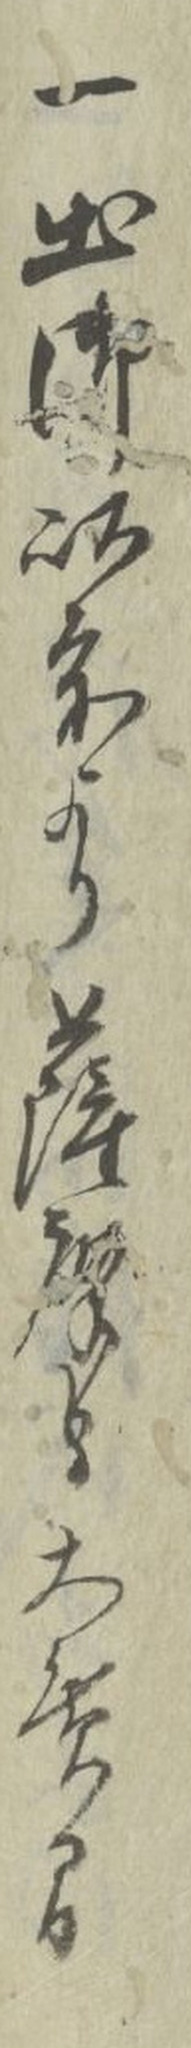一出御以前より薩摩守大広間
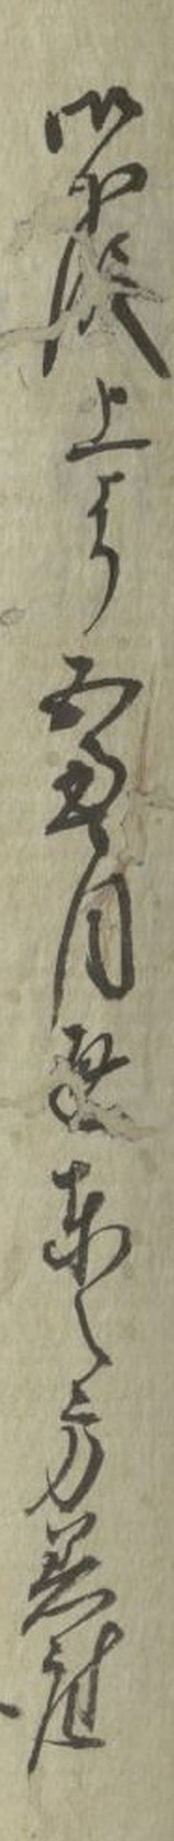御下段上より五畳目通東之方着座
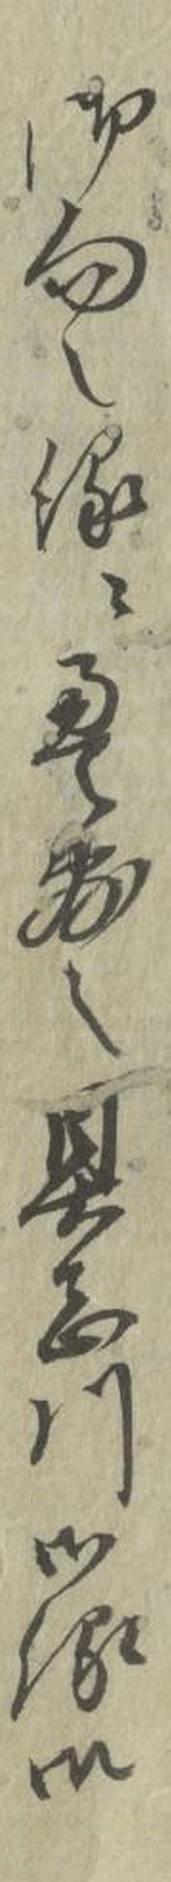御向之縁に畳敷之具志川御縁御
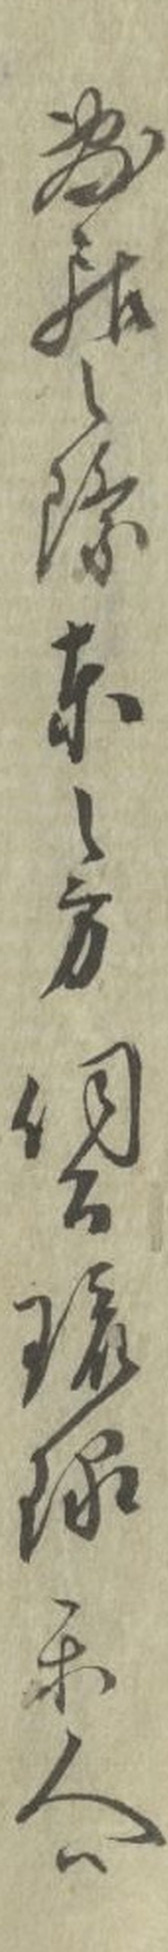敷居之際東之方伺公琉球楽人は
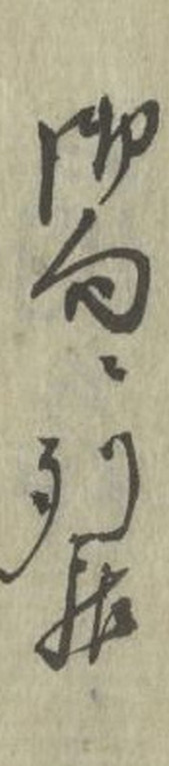御向に列居
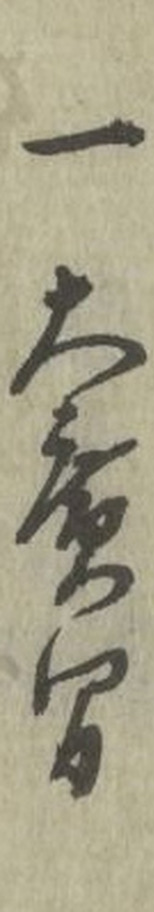一大広間

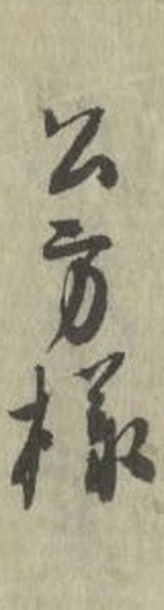公方様
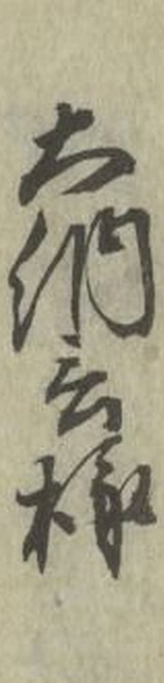大納言様
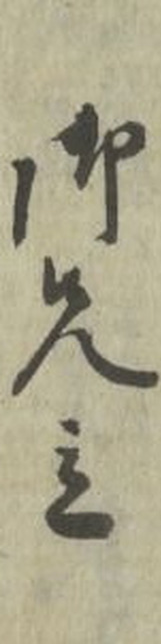御先立
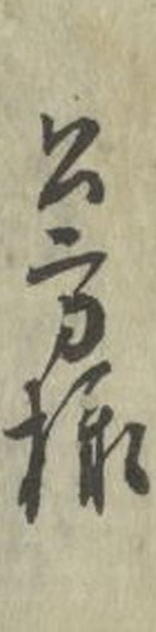公方様
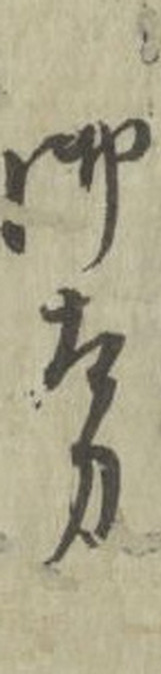御太刀
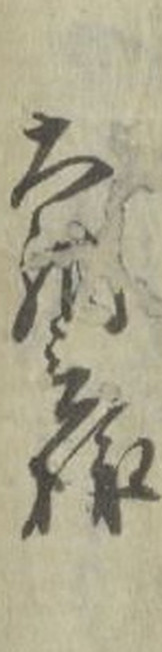大納言様
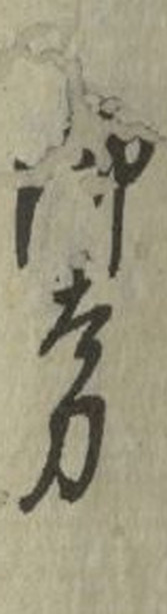御太刀
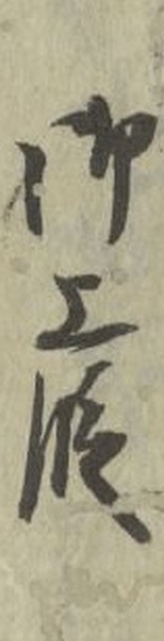御上段
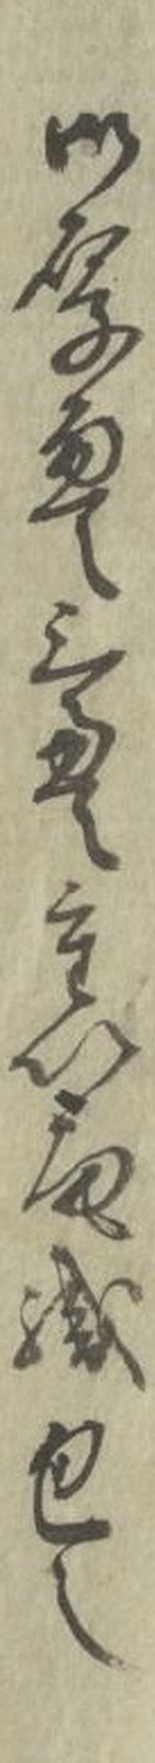御厚畳三畳重以唐織包之
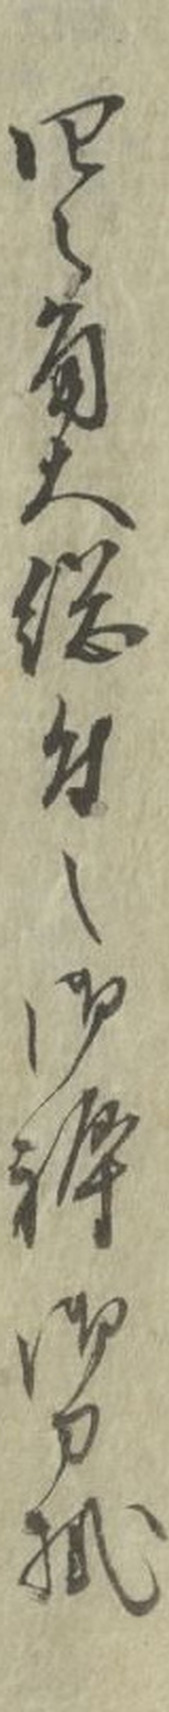四之角大総付之御褥御刀掛
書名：琉球来朝記 自八至十四終
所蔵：University of the Ryukyus Library
